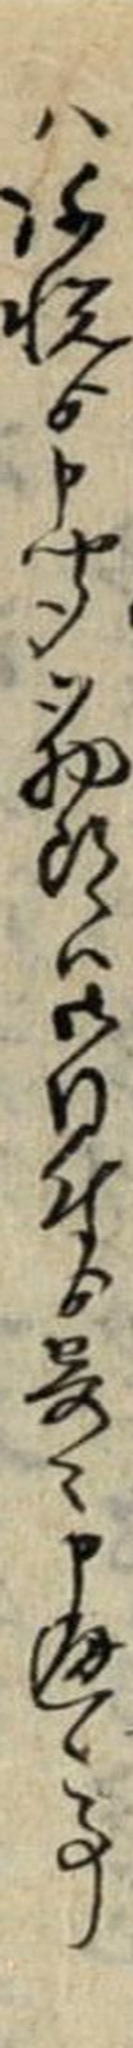は弥税ゟ申聞御物頭へは御目付ゟ寄々申通候事
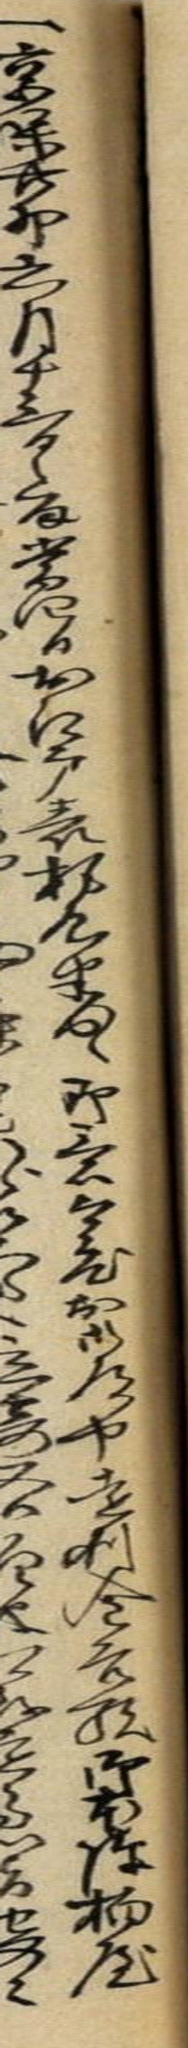一享保廿卯六月十三日之留当四日於江戸表栃谷半右衛門へ御意今度於道中遠州金谷駅御本陣柏屋
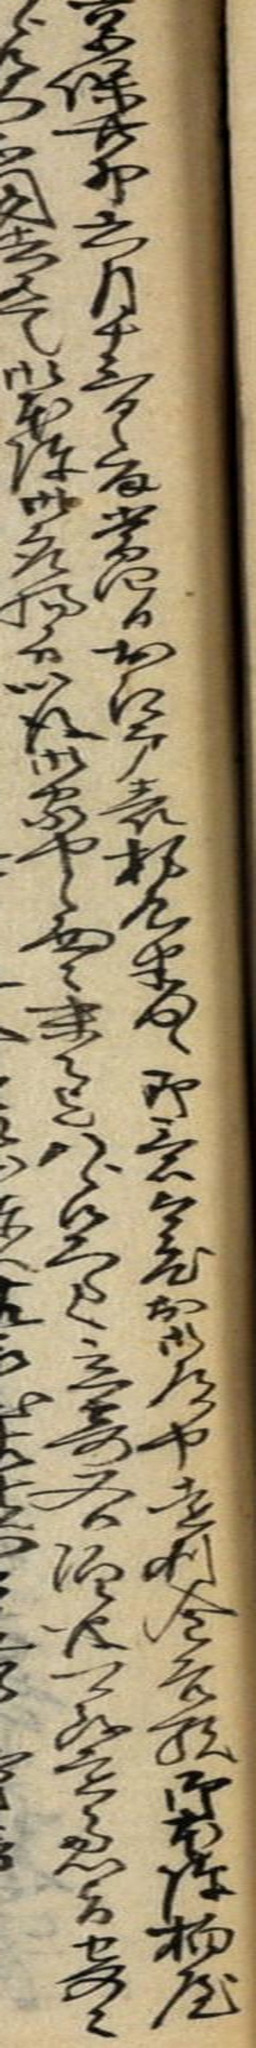八郎左衛門無調法有之御本陣御取揚候付以後御家中之面々末々迄八郎左衛門方へ立寄又は泊候儀遠慮旨寄々
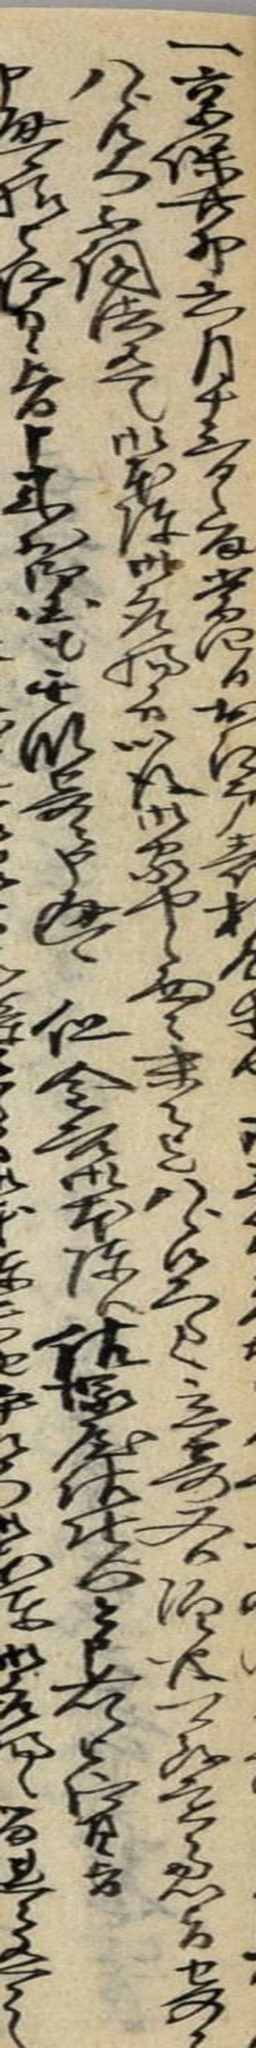申通候様被仰付候旨申来於御国も其段寄々申通候但金谷御本陣は佐塚屋佐次右衛門と申者へ被仰付候旨
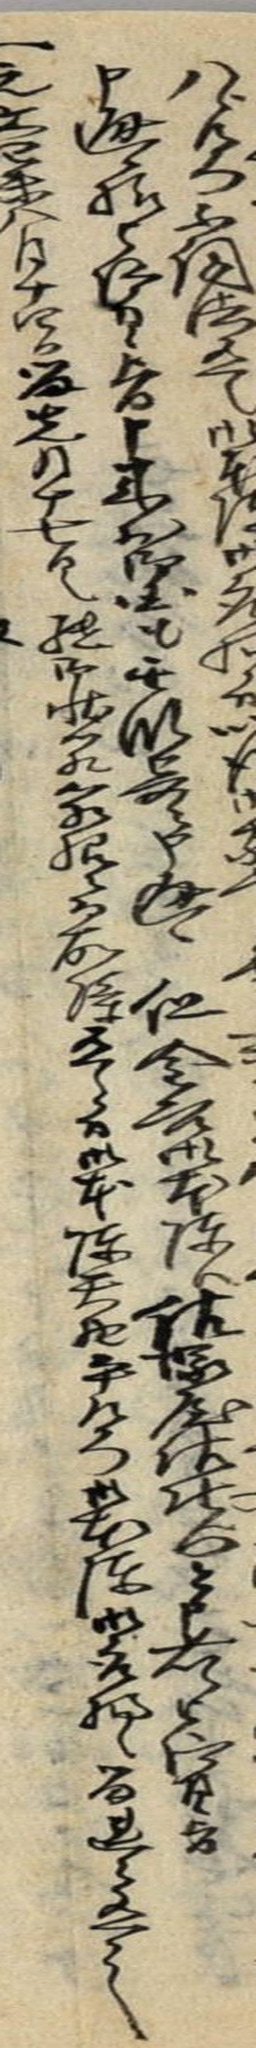一元文四未八月十四日留先月十七日之継御状箱箱根にて故障有之候付御本陣天野平左衛門御本陣御取揚之留連々有之
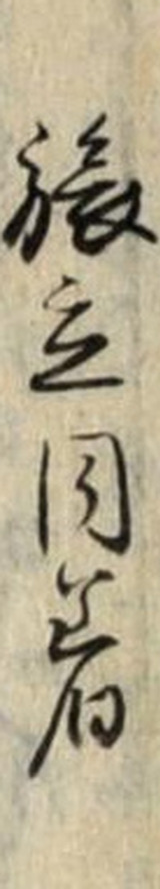旅立同着
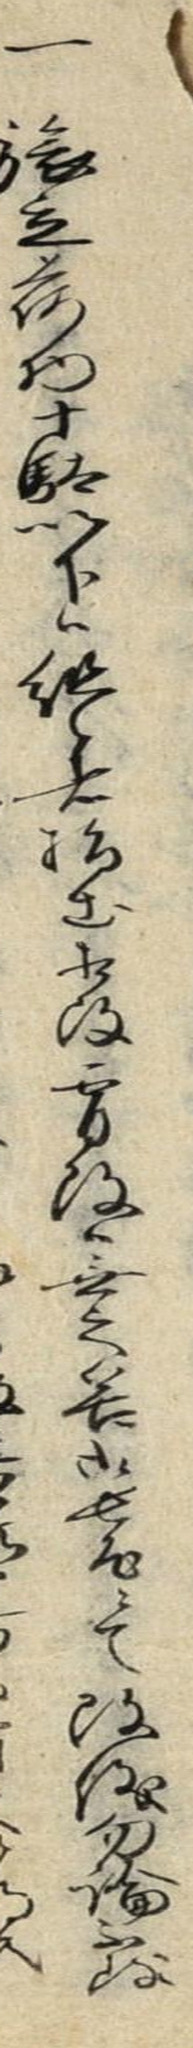一旅立荷物十駄以下は組之者指出相改宵改は無之筈御長屋にて改儀勿論不致
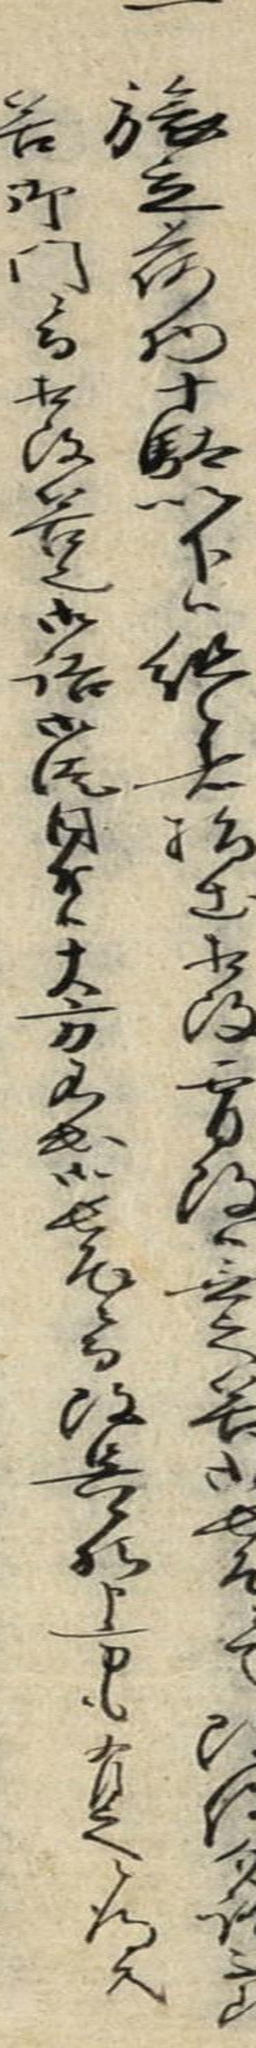筈御門にて相改筈也御詰御徒目付は大方不出長屋にて改呉候様申方も有之候得共
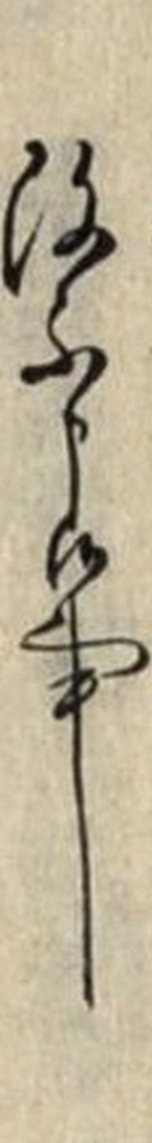改不申候事
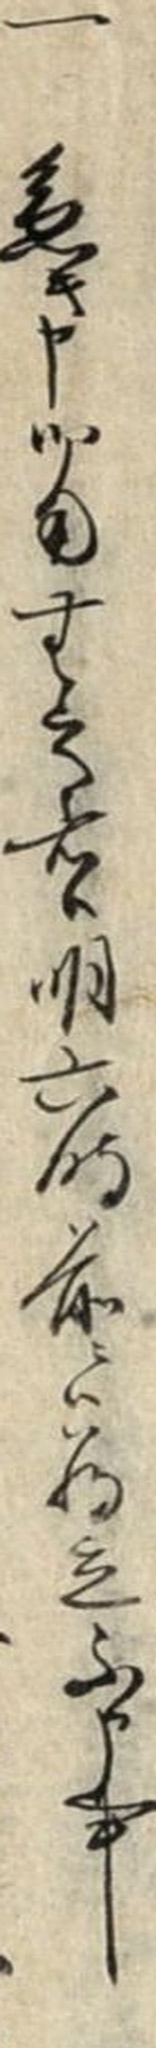一急き申御用無之者は明六時前には為立不申事
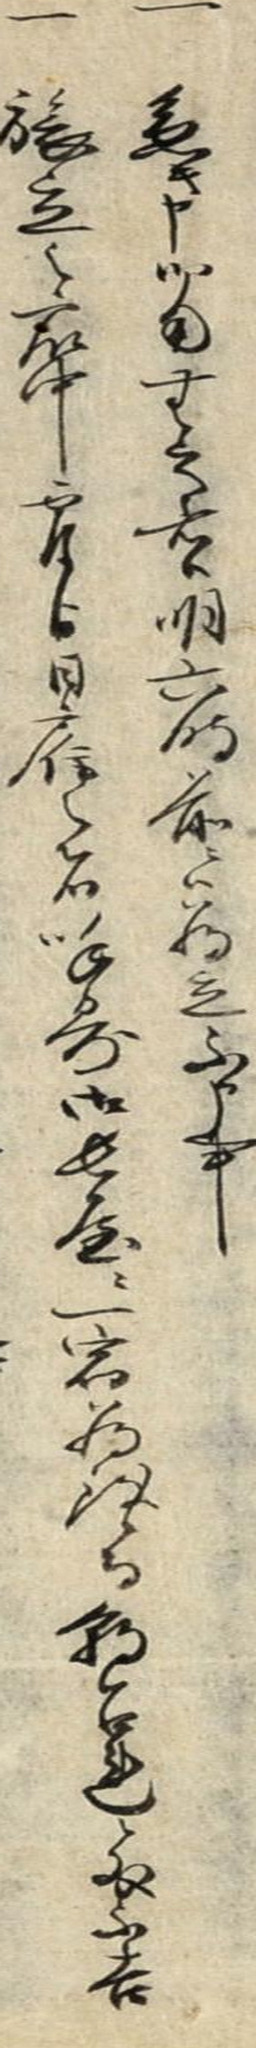一旅立之最中宵ゟ日雇之者呼寄御長屋に一宿為致候て朝召連候義不苦
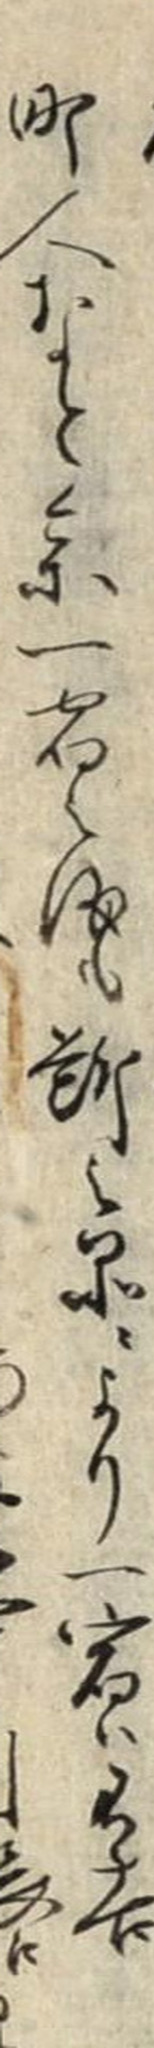町人など参一宿之儀も断之品により一宿は不苦
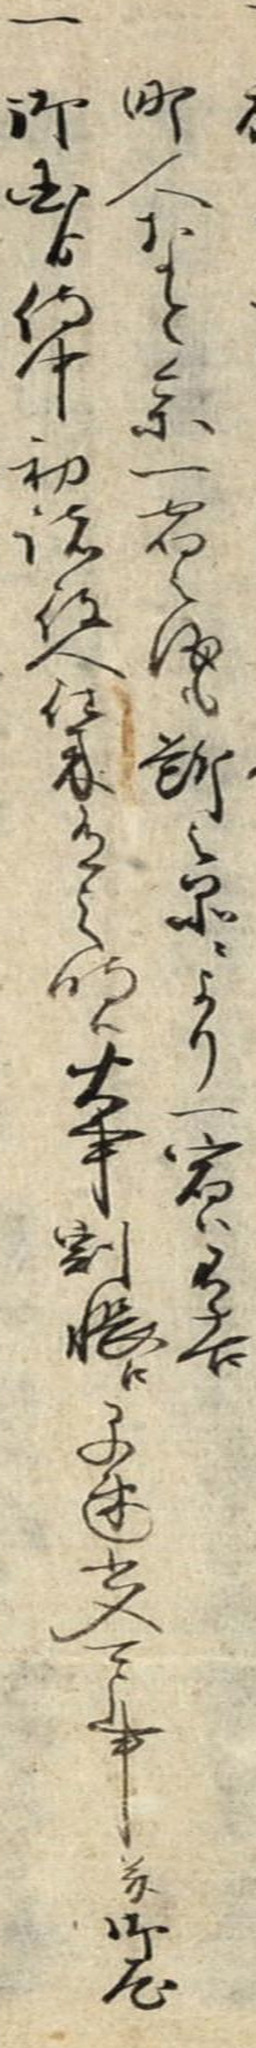一御国ゟ侍中初諸役人往来有之時は火事割帳江早速書入可申事并御屋
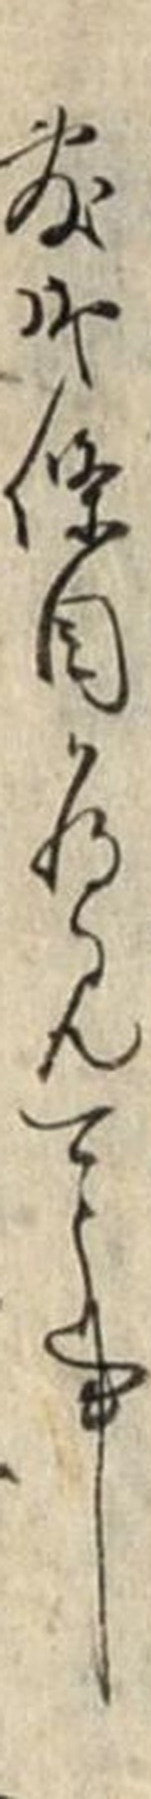敷御條目為見可申事
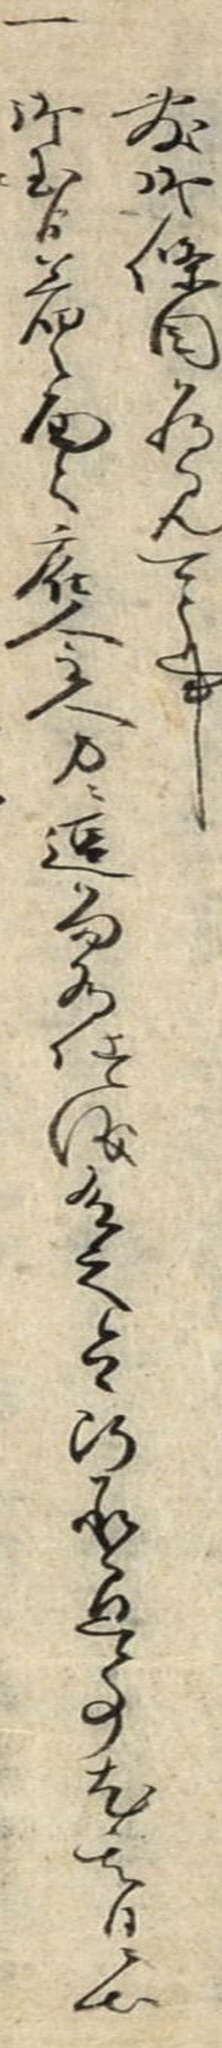一御国ゟ着之面々雇人主人方に逗留為仕候儀有之候はゝ断承置候事尤其日に出
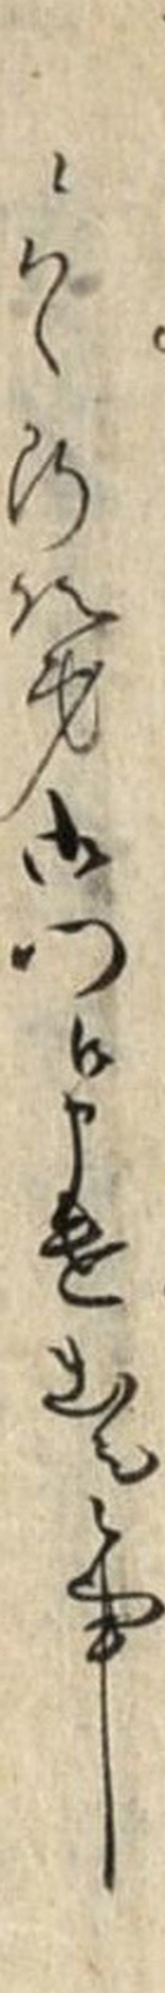候はゝ断次第御門江申遣出し候事
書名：三都并道中之部
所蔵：福井県文書館 Fukui Prefectural Archives
